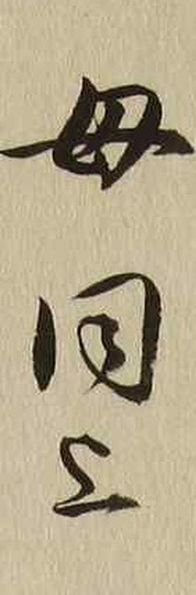母同上
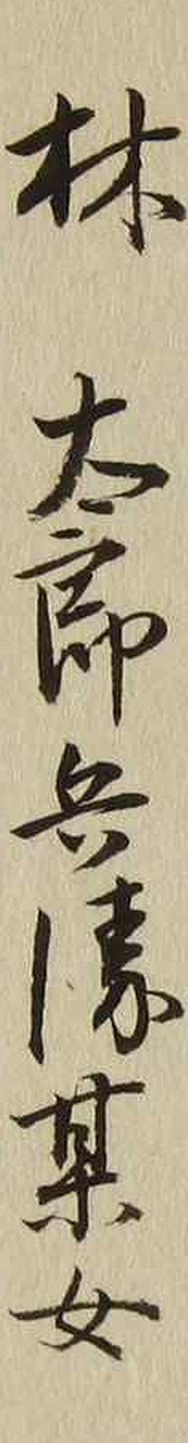林太郎兵衛某女
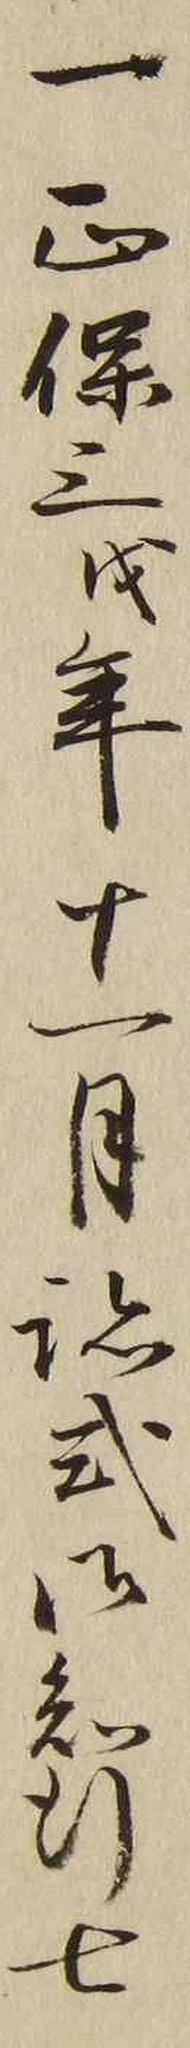一正保三戌年十一月跡式御知行七

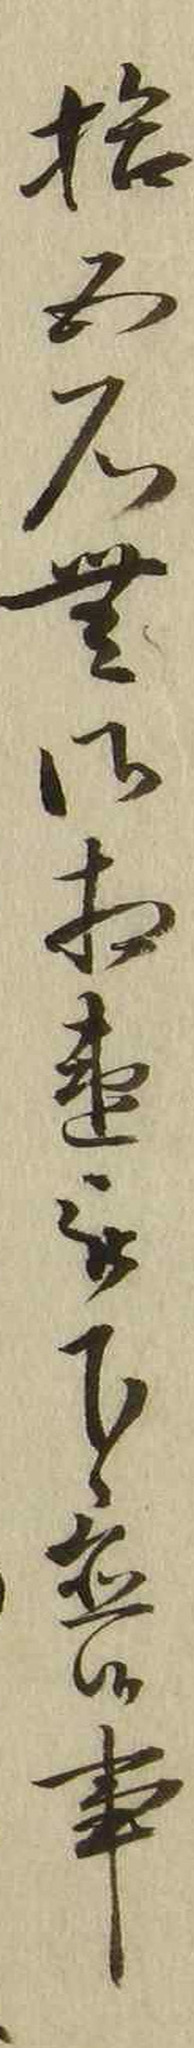拾五石無御相違被下置候事
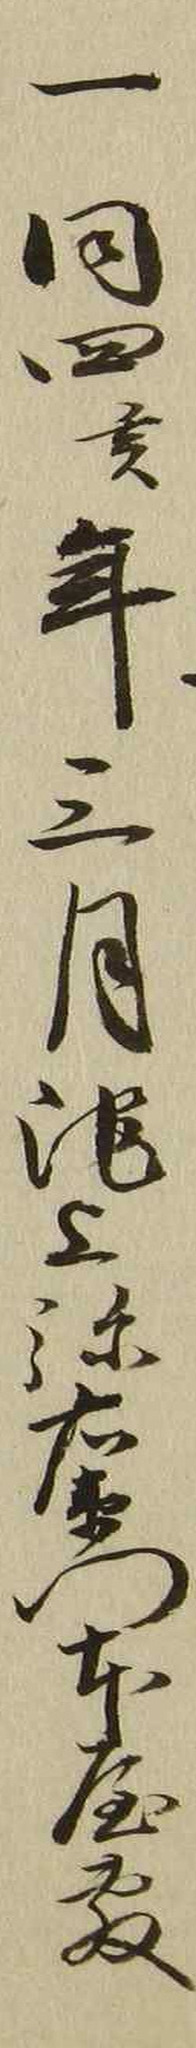一同四亥年三月池上弥右衛門本屋敷
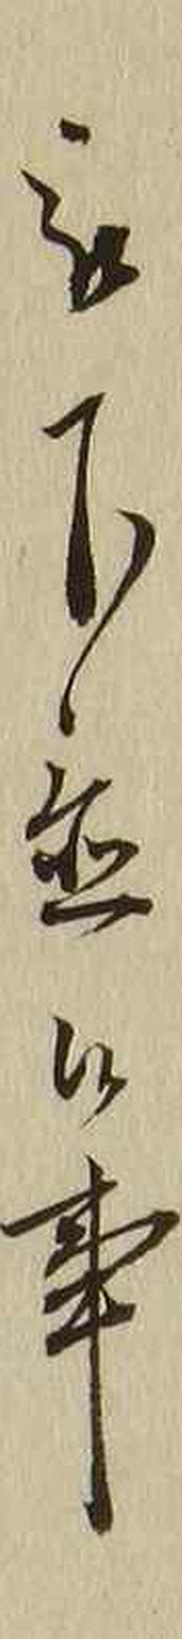被下置候事
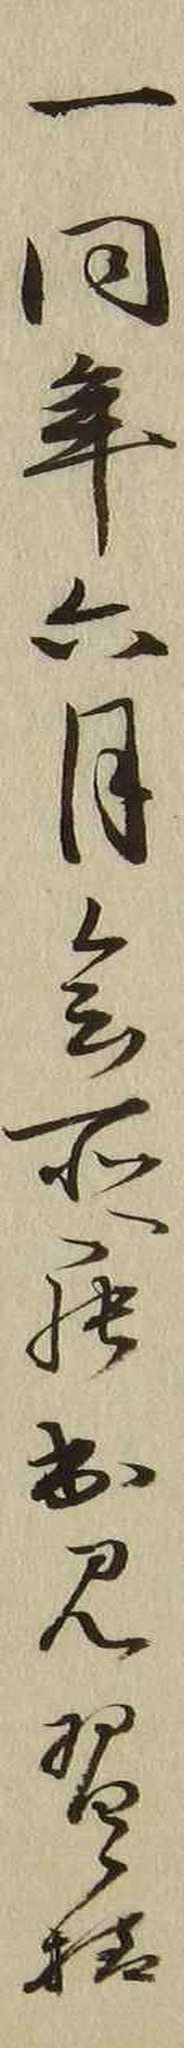一同年六月会所へ罷出見習候様
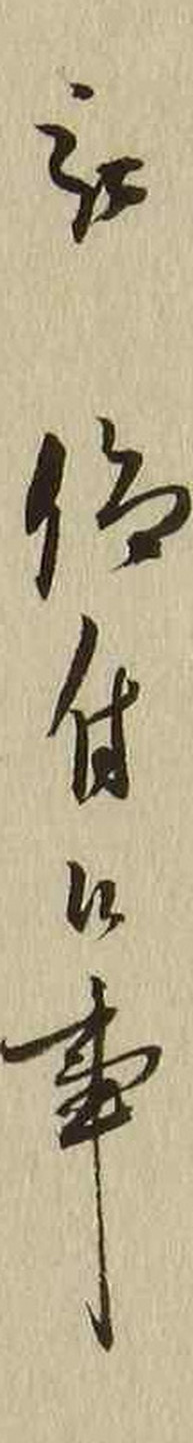被仰付候事
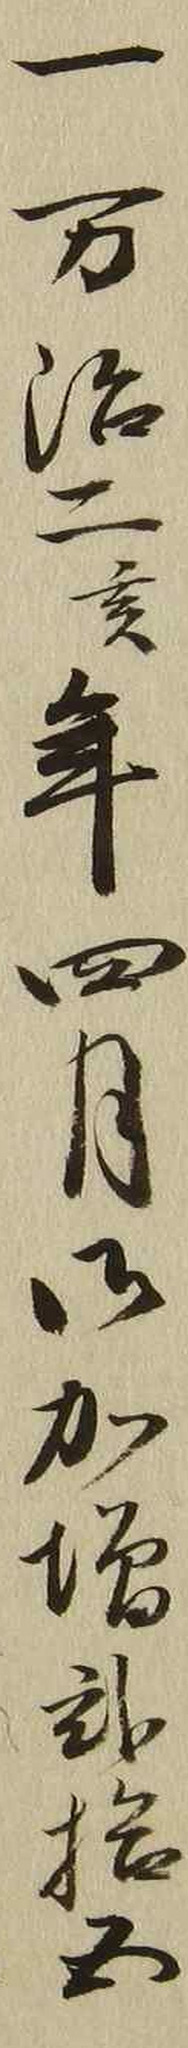一万治二亥年四月御加増弐拾五
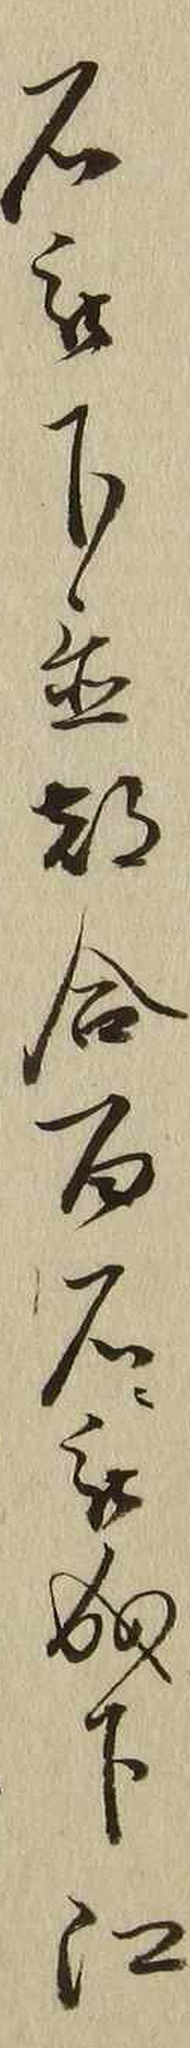石被下置都合百石ニ被成下江
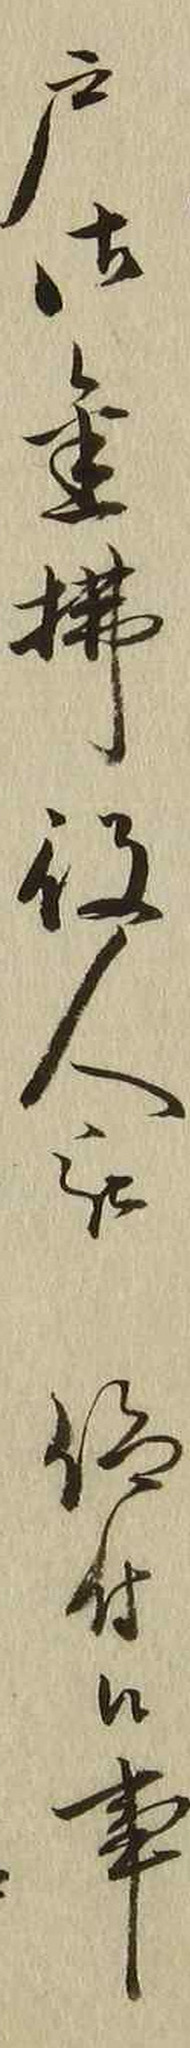戸御金払役人被仰付候事
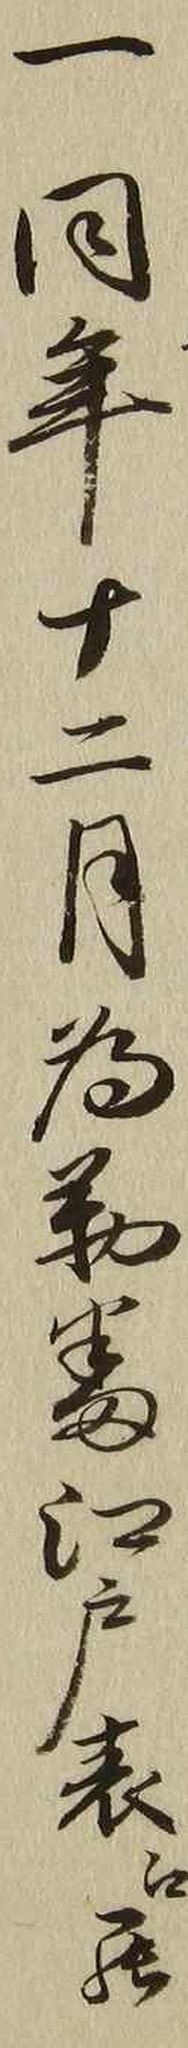一同年十二月為勤番江戸表江罷
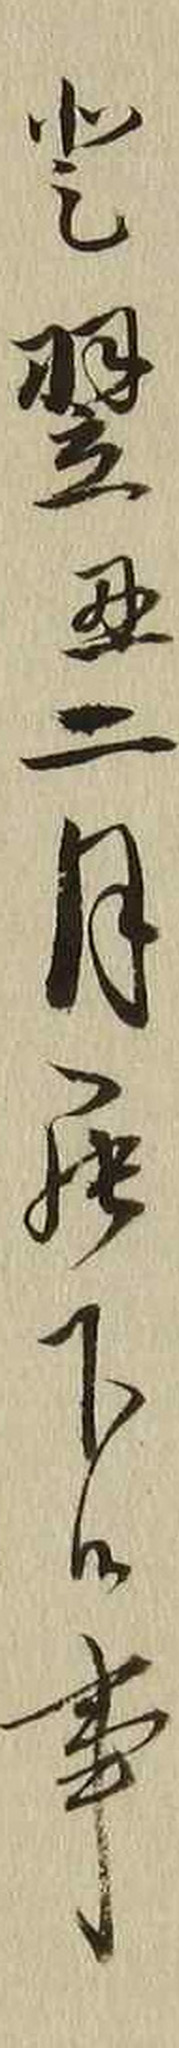登翌丑二月罷下候事
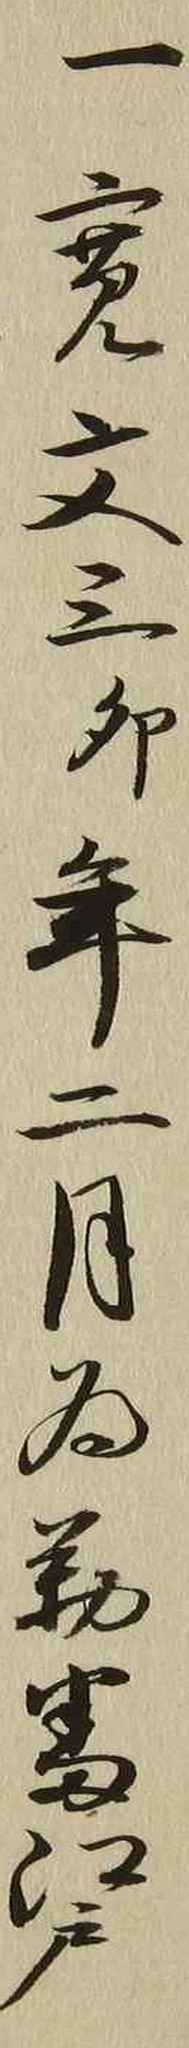一寛文三卯年二月為勤番江戸
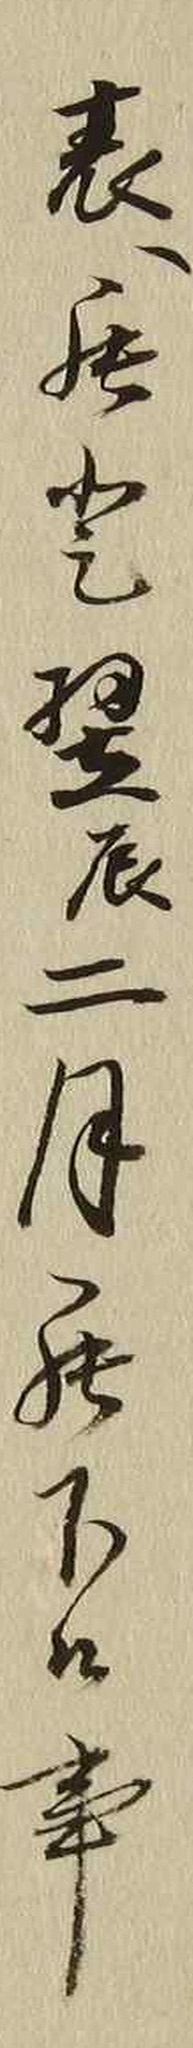表へ罷登翌辰二月罷下候事
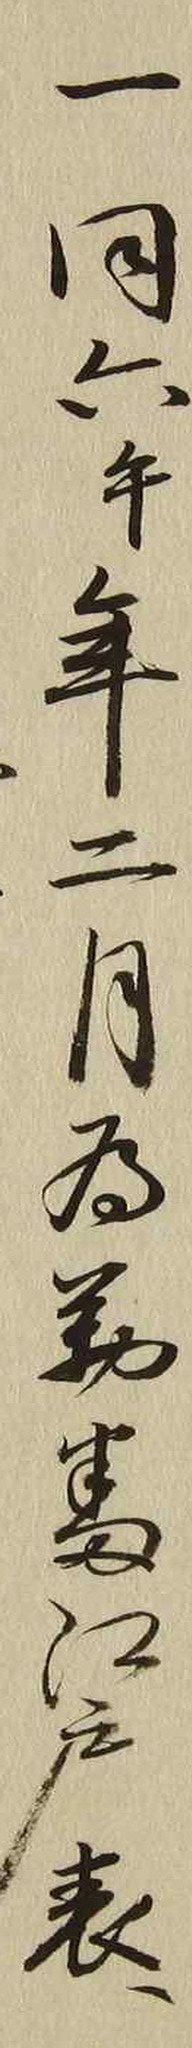一同六午年二月為勤番江戸表へ
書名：諸士系譜　巻之61　と之部4
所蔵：会津若松市立会津図書館
